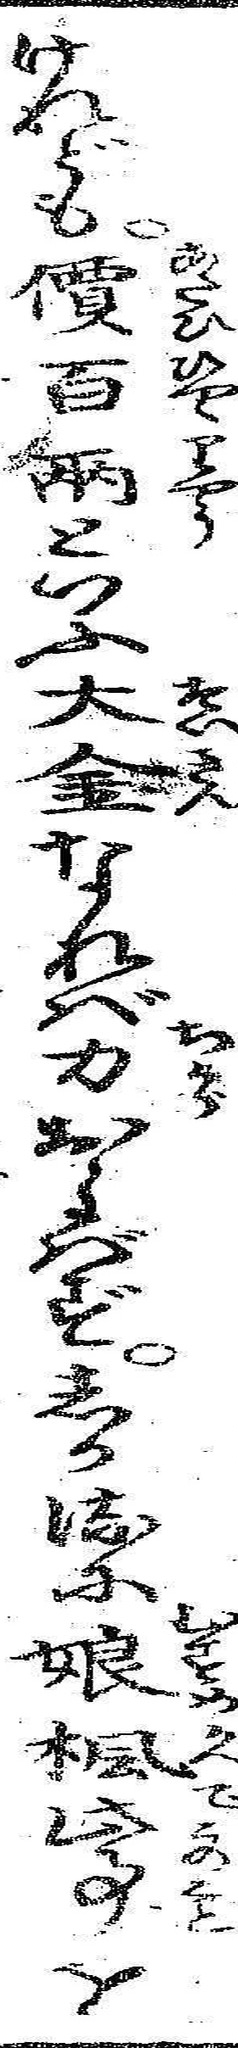けれども。價百両といふ大金なれば力およばず。しかるに娘楓此事を
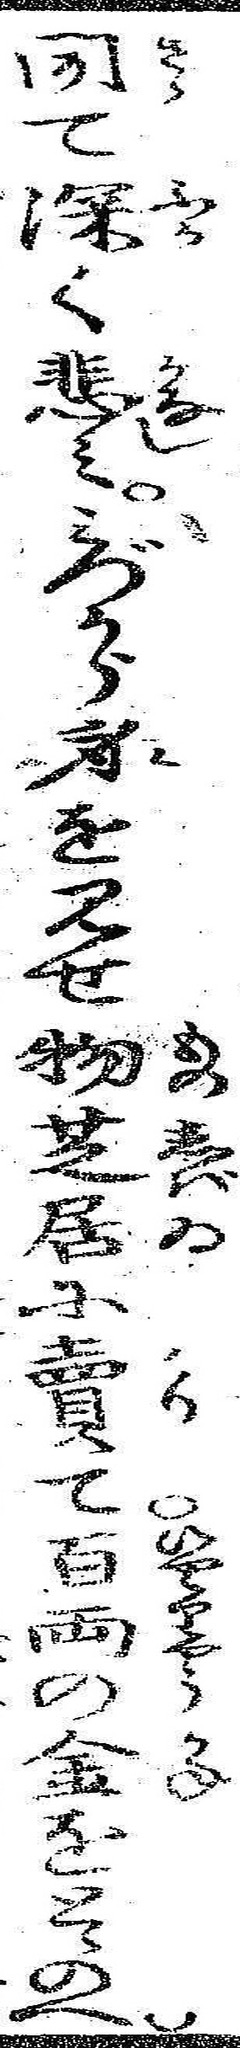聞て深く悲み。みづから身を見せ物芝居に売て。百両の金をとゝのへ。
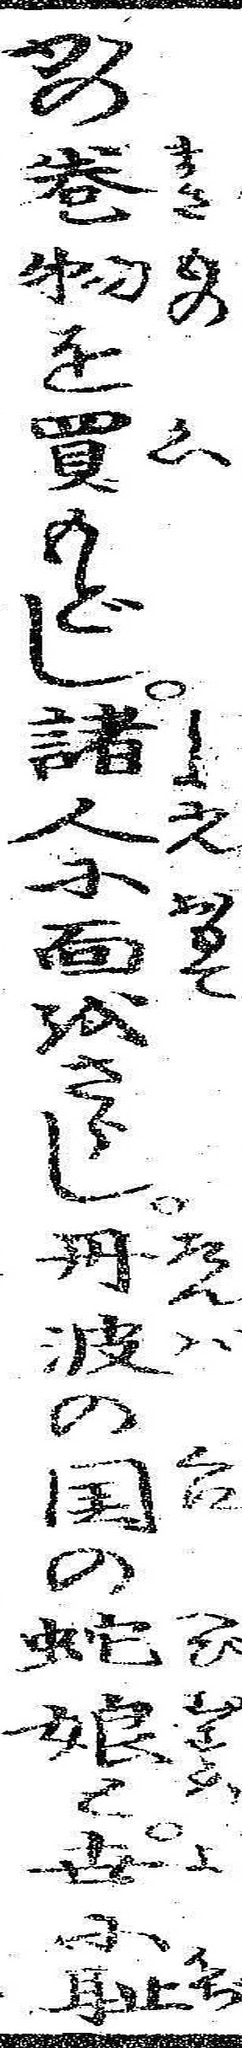かの巻物を買もどし。諸人に面をさらし。丹波の国の蛇娘と。世に恥
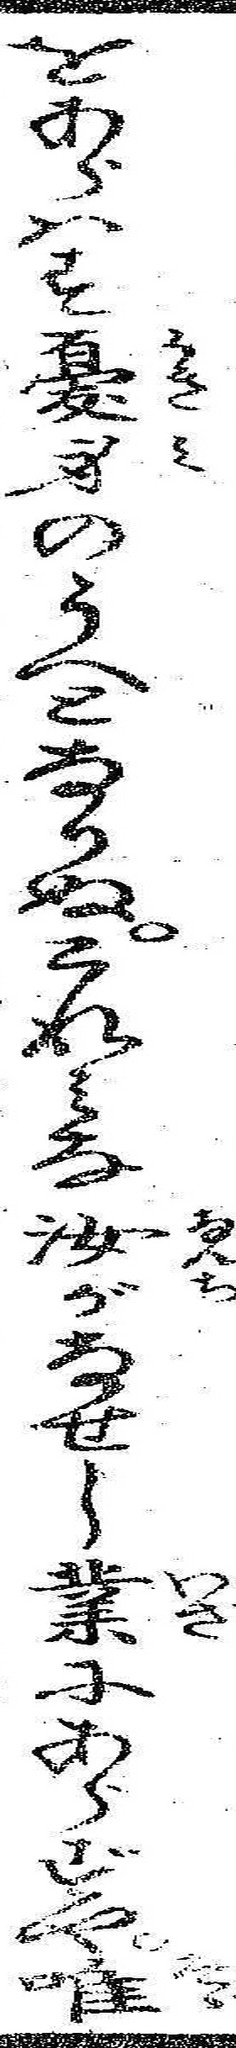をあらはす憂身のうへとなりぬ。これみな汝がなせし業にあらずや。唯
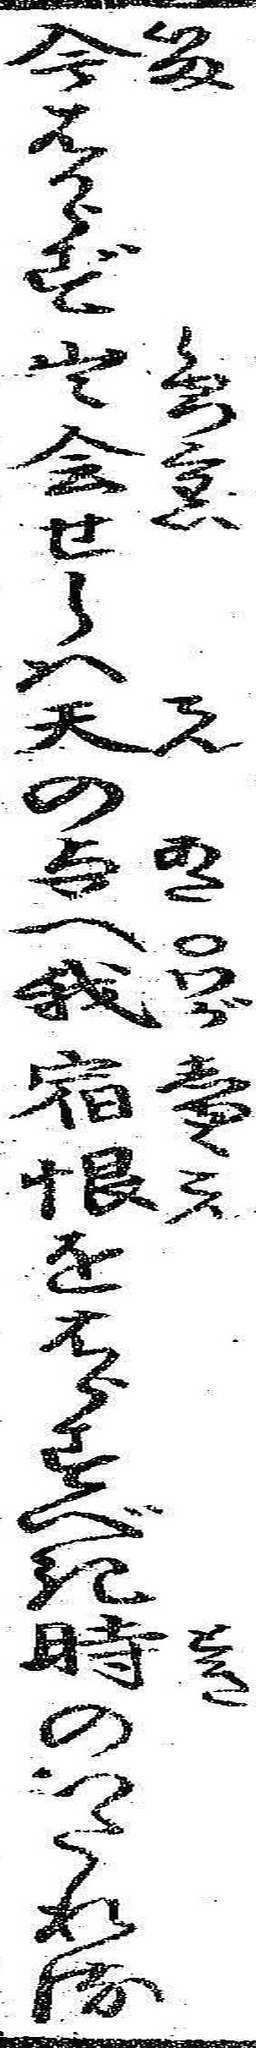今はからず出会せしは天の与へ。我宿恨をはらすべき時のいたれる
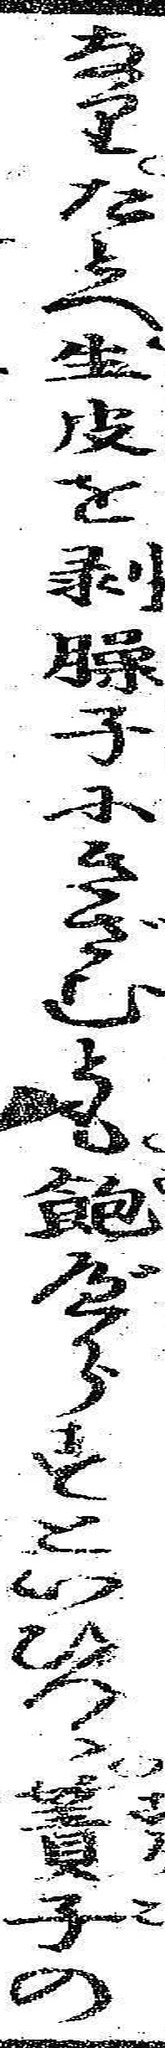なり。たとへ生皮を剥臊子にきざむとも。飽べからすといひつゝ。簀子の
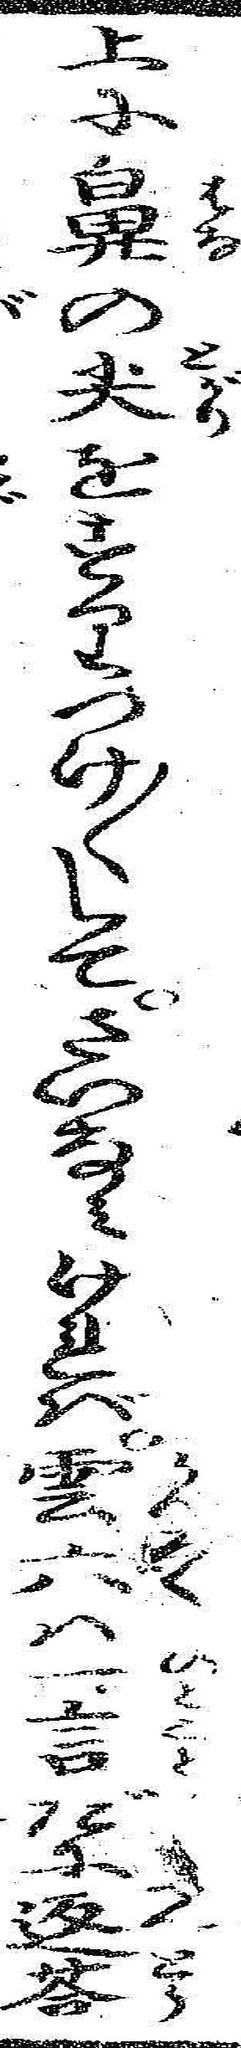上に鼻の尖をすりつけ〳〵して。さいなみければ。雲六は一言だに返荅
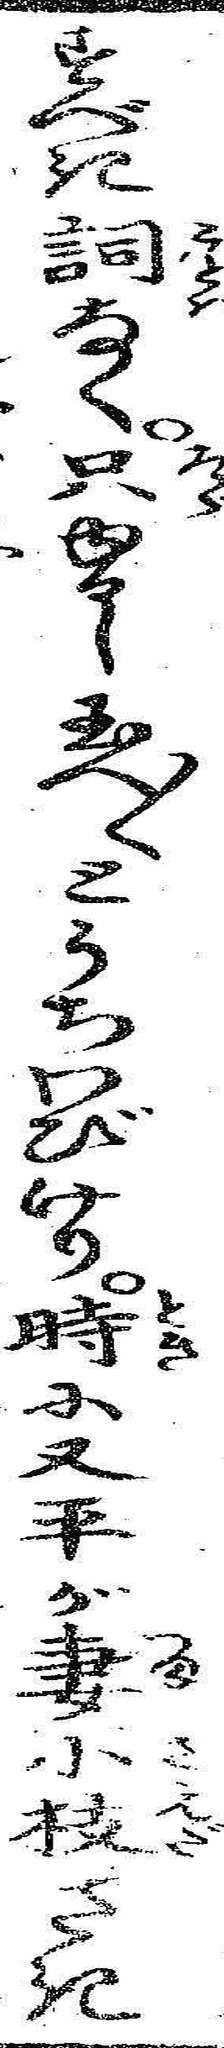すべき詞なく。只ゆるし玉へ〳〵とうちわびけり。時に又平が妻小枝さき
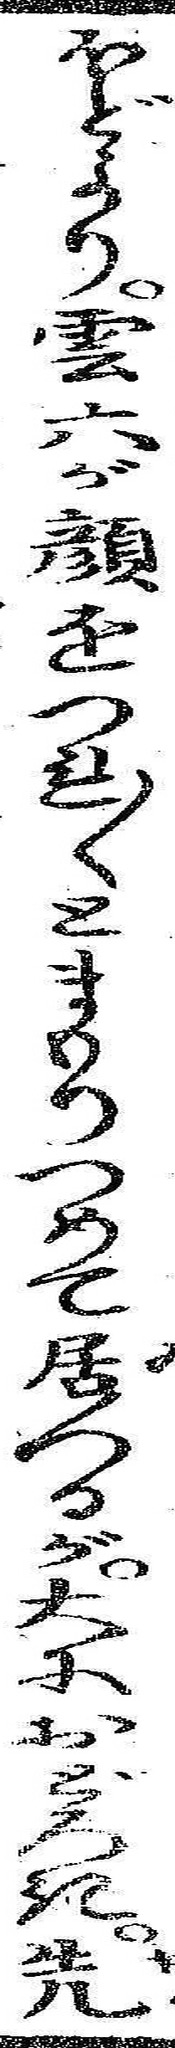ほどより。雲六が顔をつれ〳〵とまもりつめて居つるが。大におどろき。先
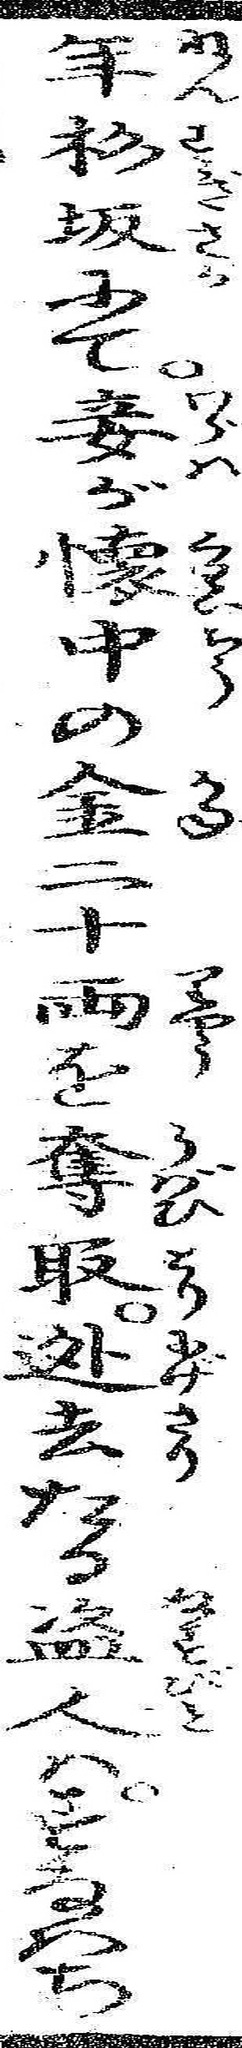年杉坂にて。妾が懐中の金二十両を奪取。逃去たる盗人は。すなはち
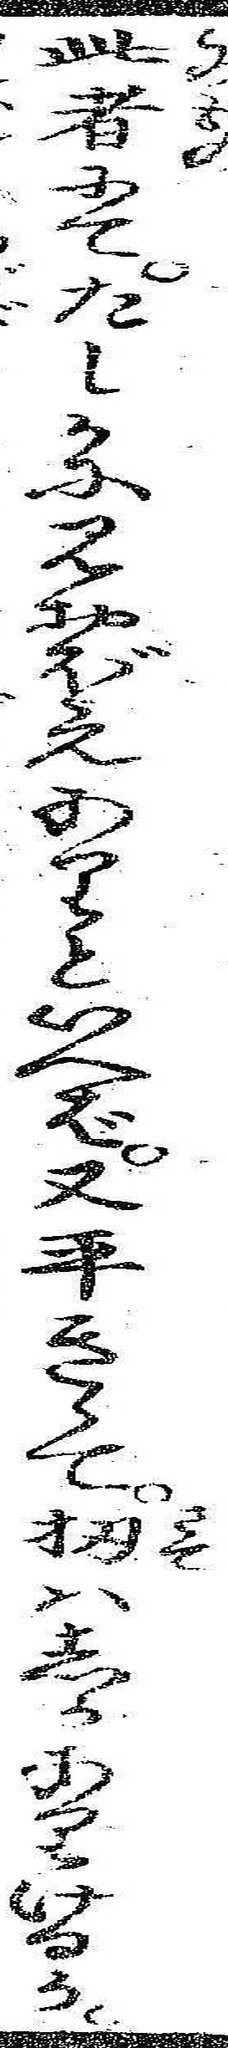此者にて。たしかに見おぼえありといへば。又平きゝて。扨はしかありけるか。
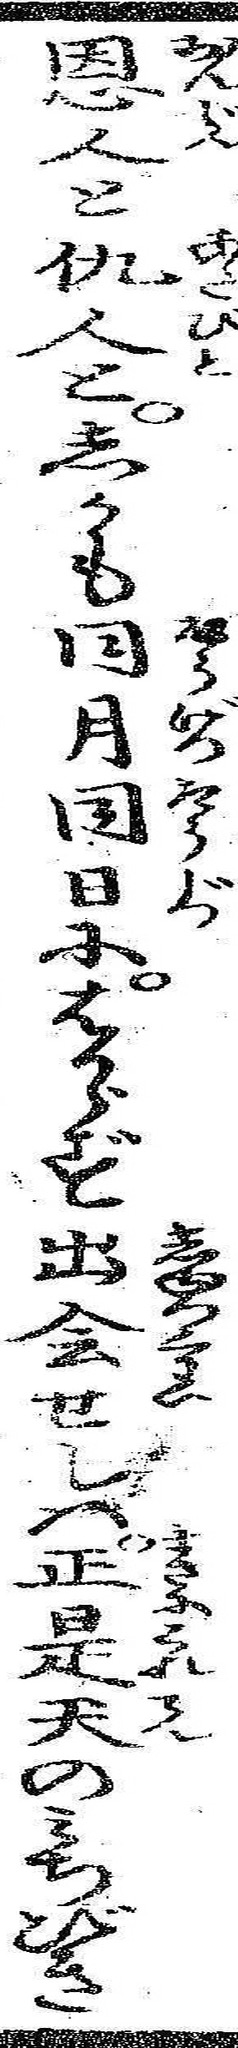恩人と仇人と。しかも同月同日に。はからず出会せしは。正是天のみちびき
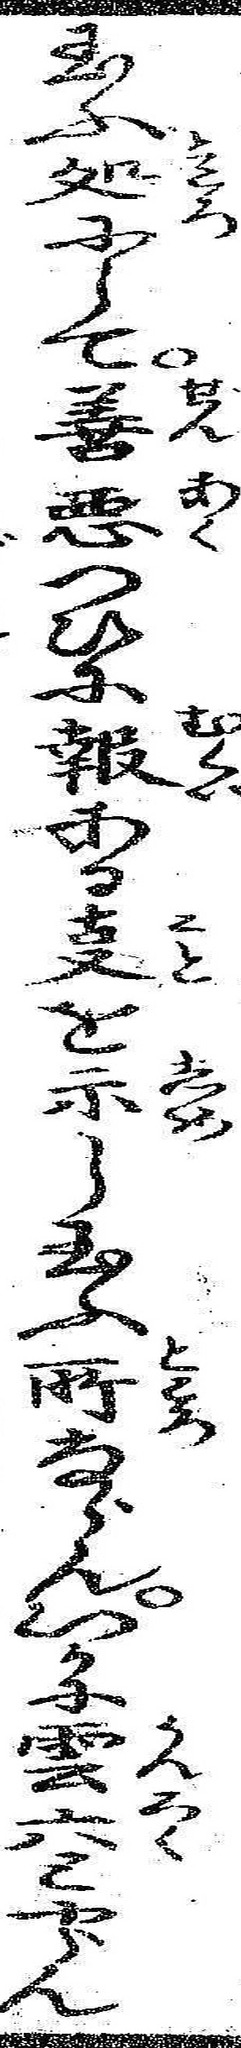玉ふ処にして。善悪つひに報ある事を示し玉ふ所ならん。いかに雲六とやらん
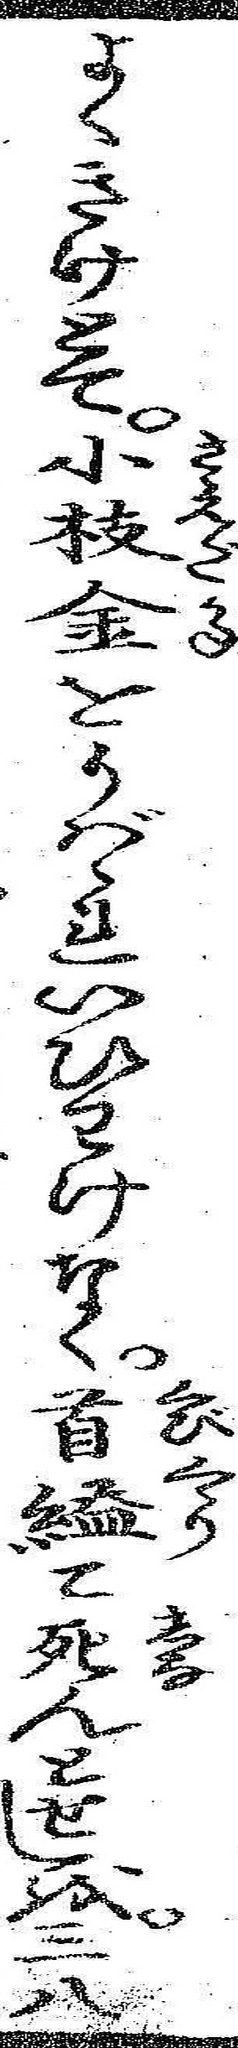よくきけとて。小枝金をうばゝれいひわけなく。首縊て死んとせしを。三八
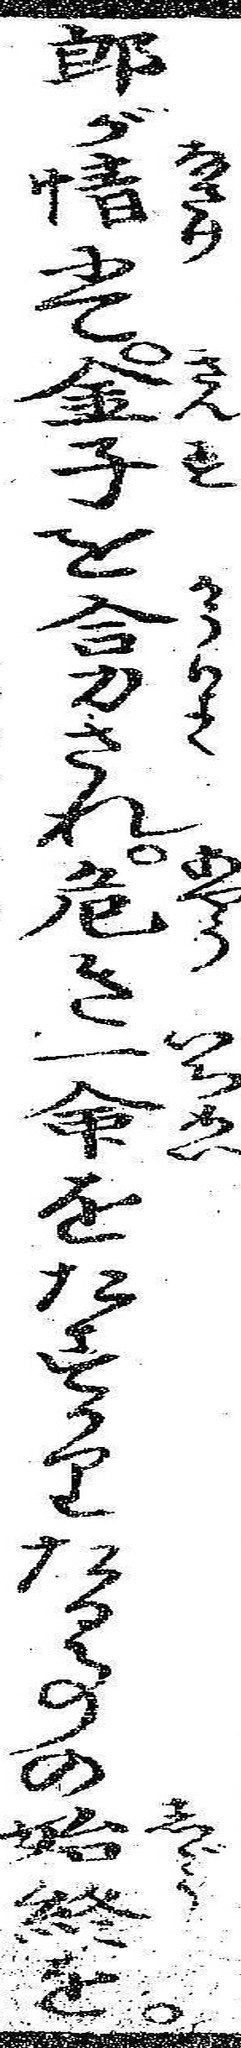郎が情にて。金子を合力され。危き一命をたすかりたる事の始終を。
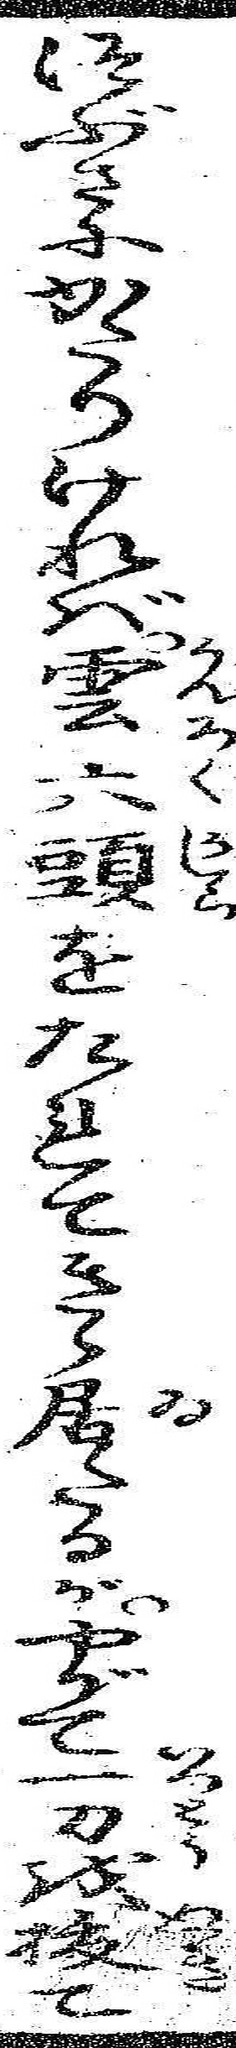つぶさにかたりければ。雲六頭をたれてきゝ居たるが。やがて一刀を抜て
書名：昔話稲妻表紙
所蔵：国文学研究資料館
